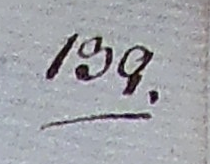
139.
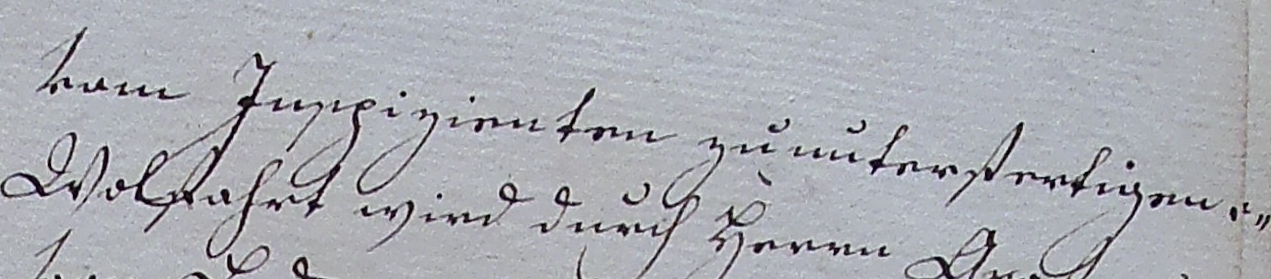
vom Inspizienten zu unterfertigen,
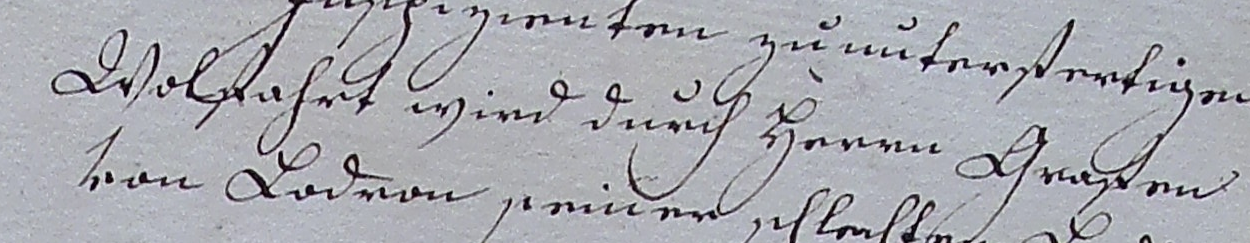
Wolfahrt wird durch Herrn Grafen
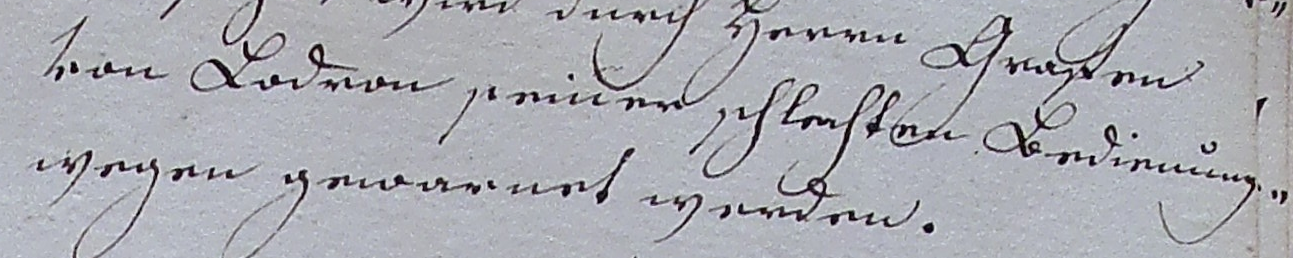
von Lodron seiner schlechten Bedienung.
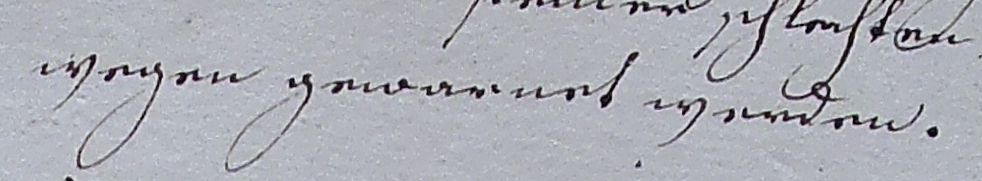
wegen gewarnet werden.
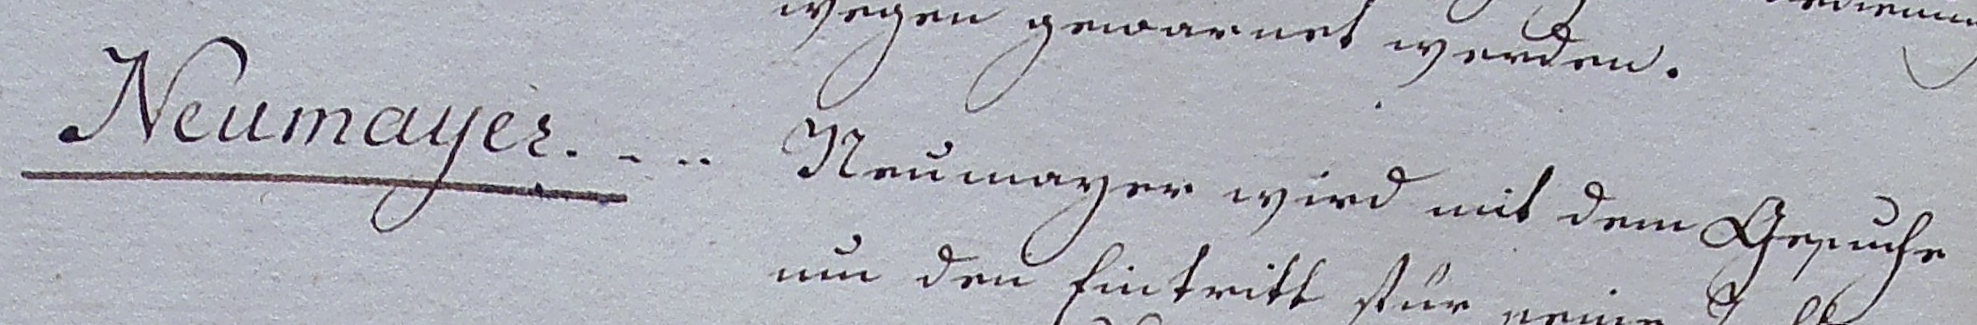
Neumayer. .. .. Neumayer wird mit dem Gesuche
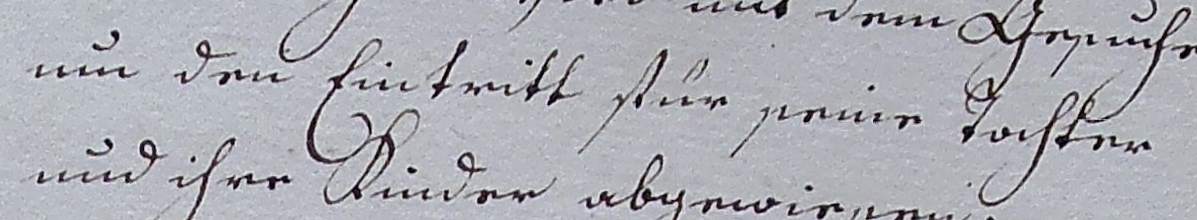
um den Eintritt für seine Tochter
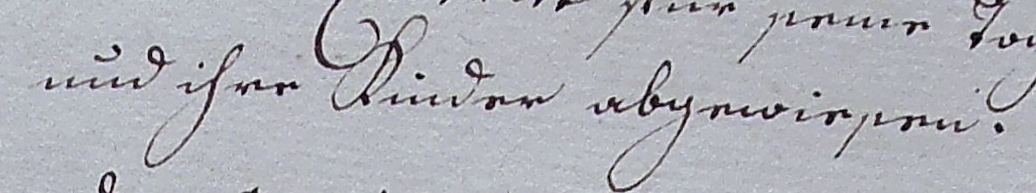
und ihre Kinder abgewiesen.
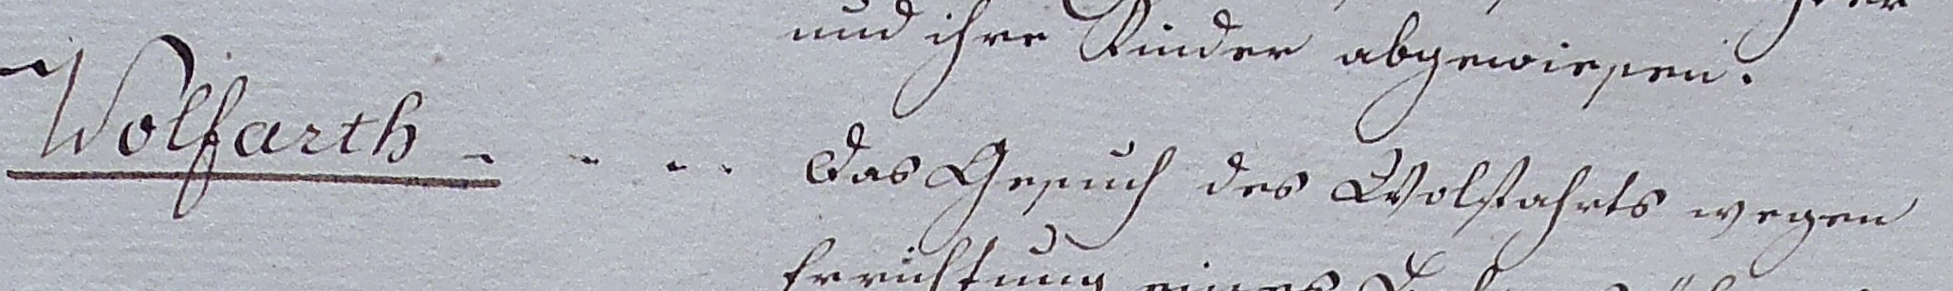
Wolfarth .. .. .. . Das Gesuch des Wolfahrts wegen
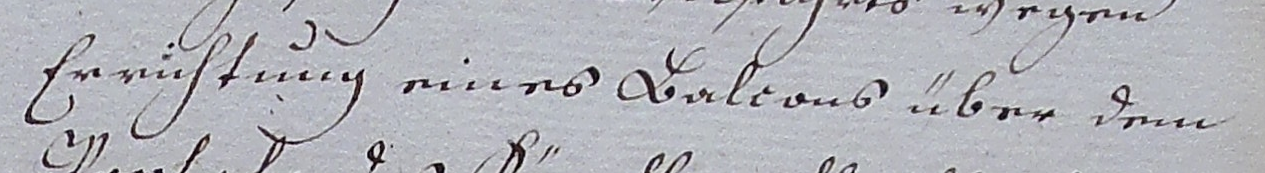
Errichtung eines Balcons über dem
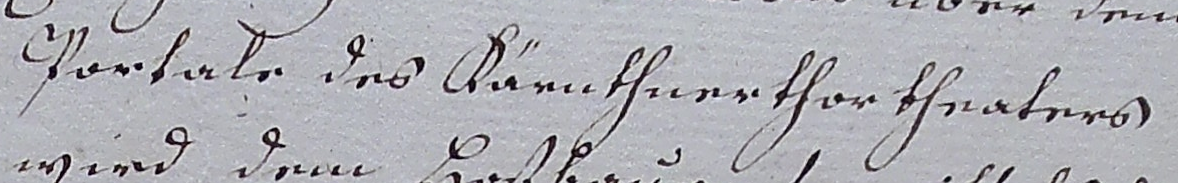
Portale des Kärnthnerthortheaters
